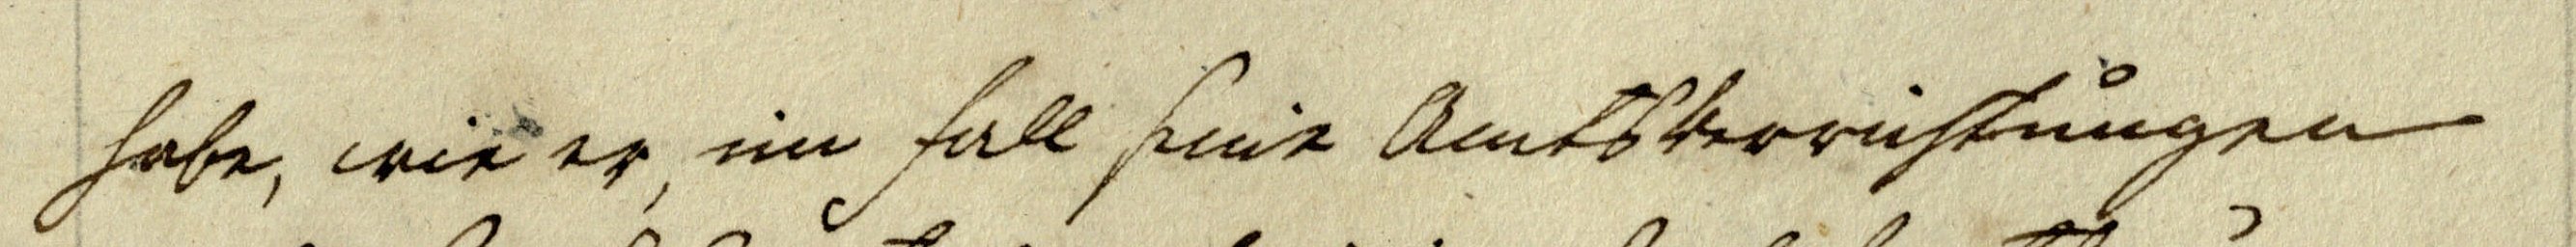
habe, wie er im Fall seine Amtsverrichtungen
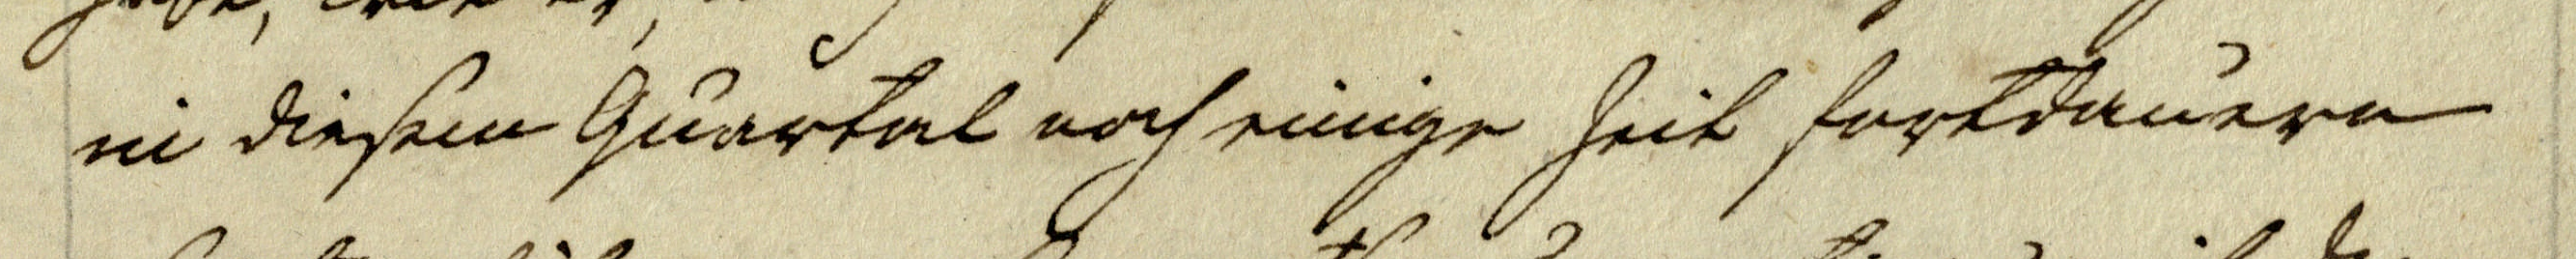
in diesem Quartal noch einge Zeit fortdauern
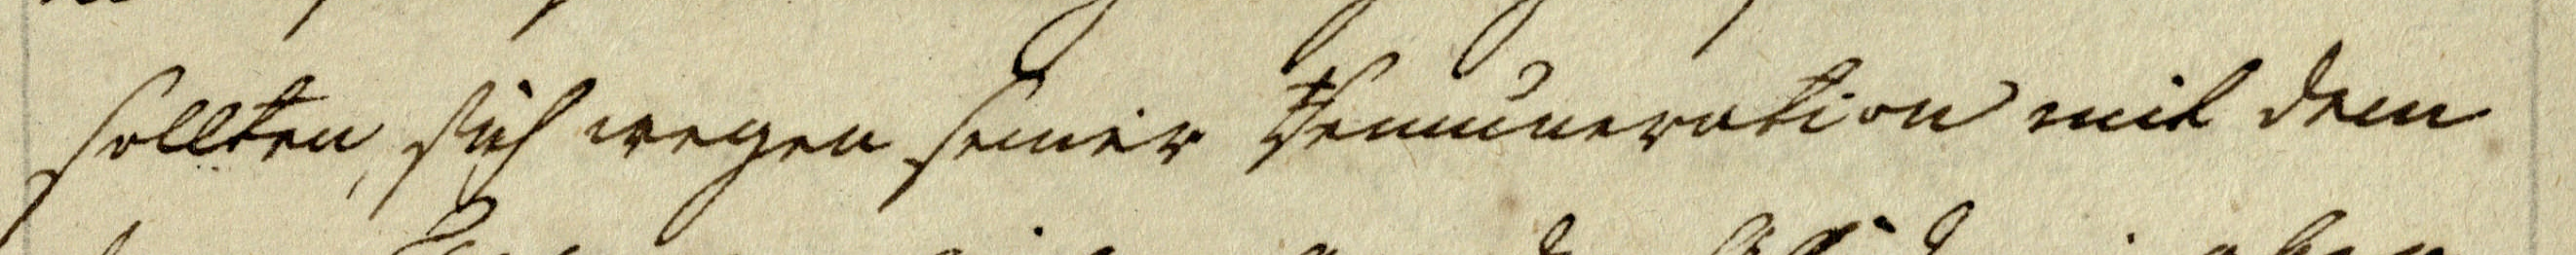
sollten, sich wegen seiner Remuneration mit dem
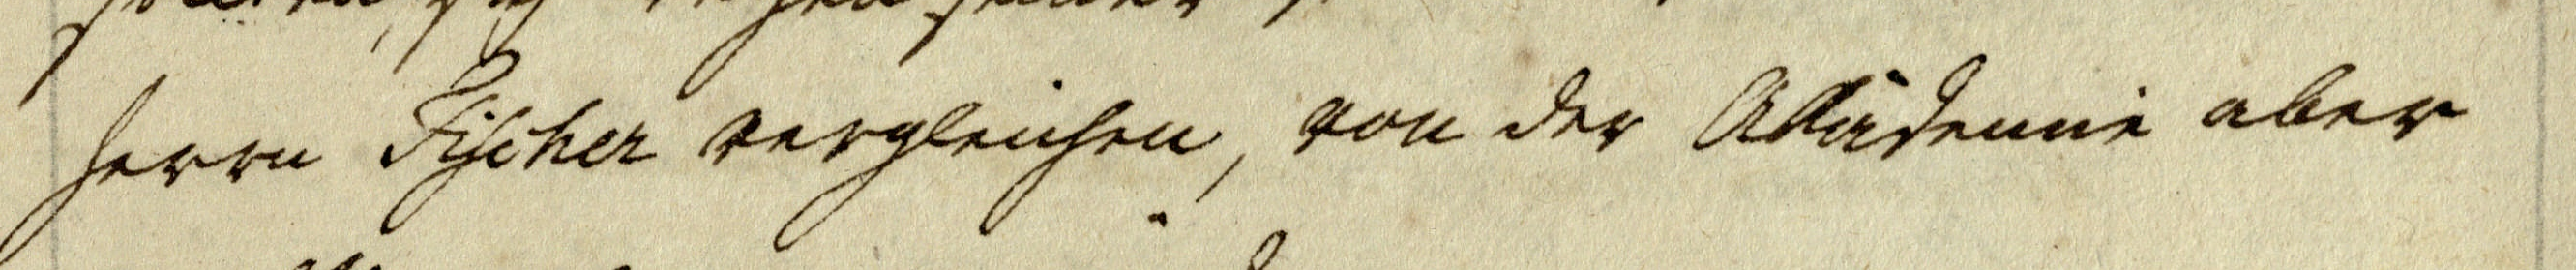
Herrn Fischer vergeichen, von der Akademie aber
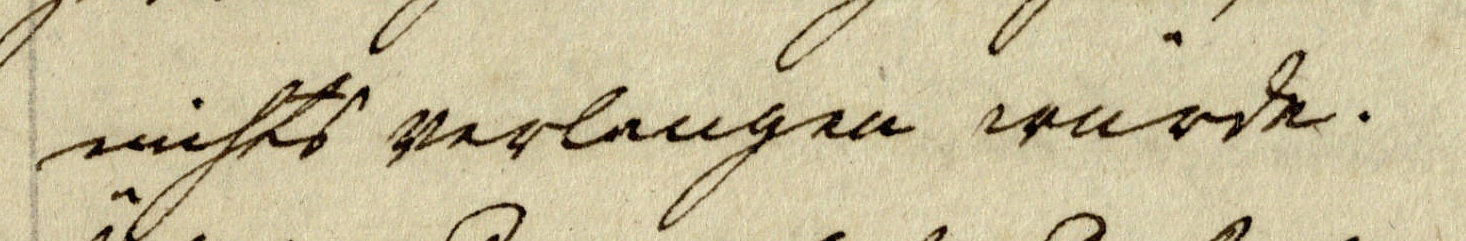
nichts verlangen würde.
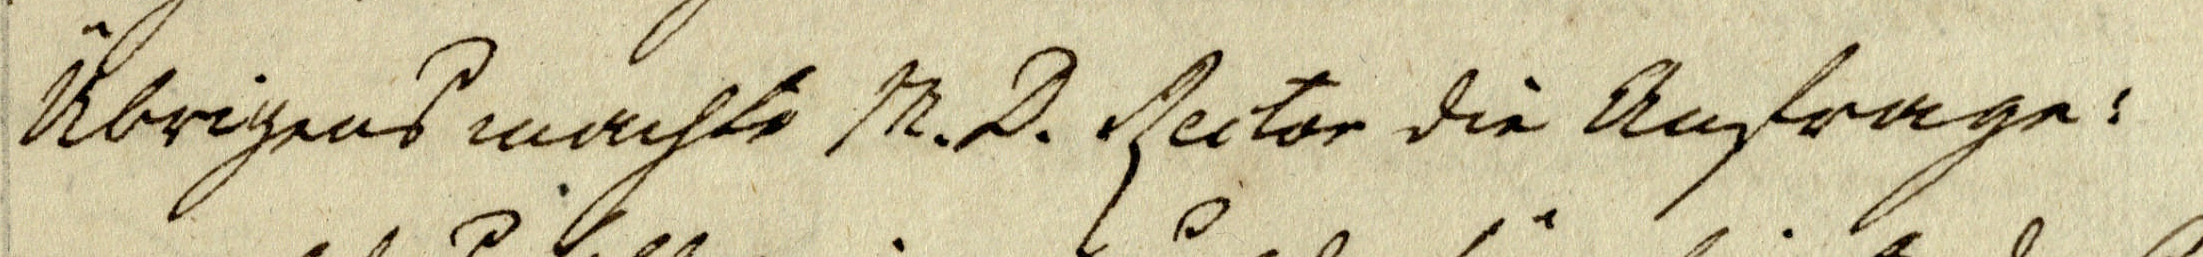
Übrigens machte M. D. Rector die Anfrage:
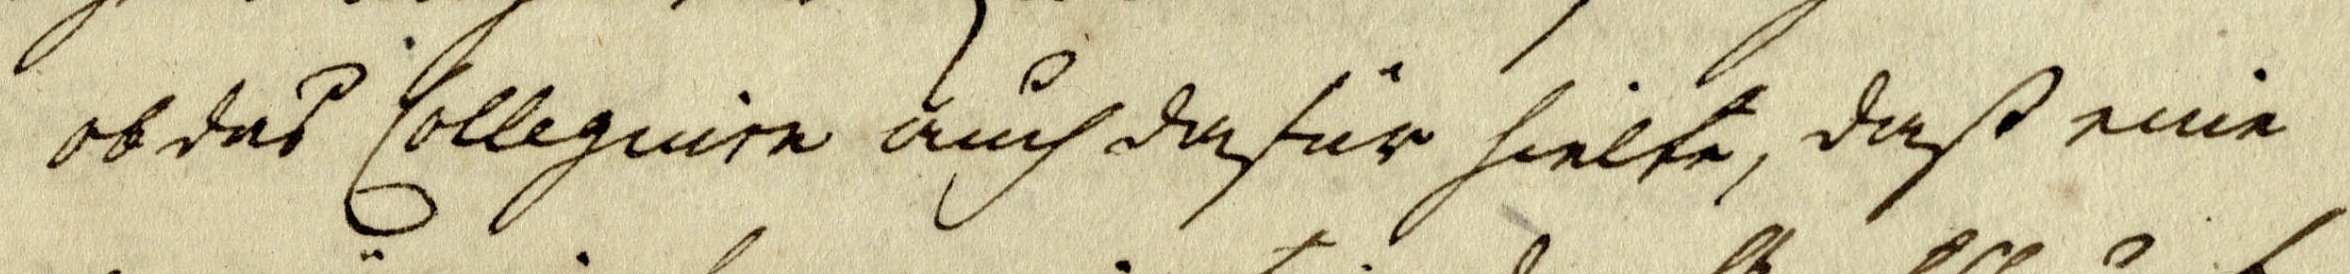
ob das Collegium auch dafür hielte, daß eine
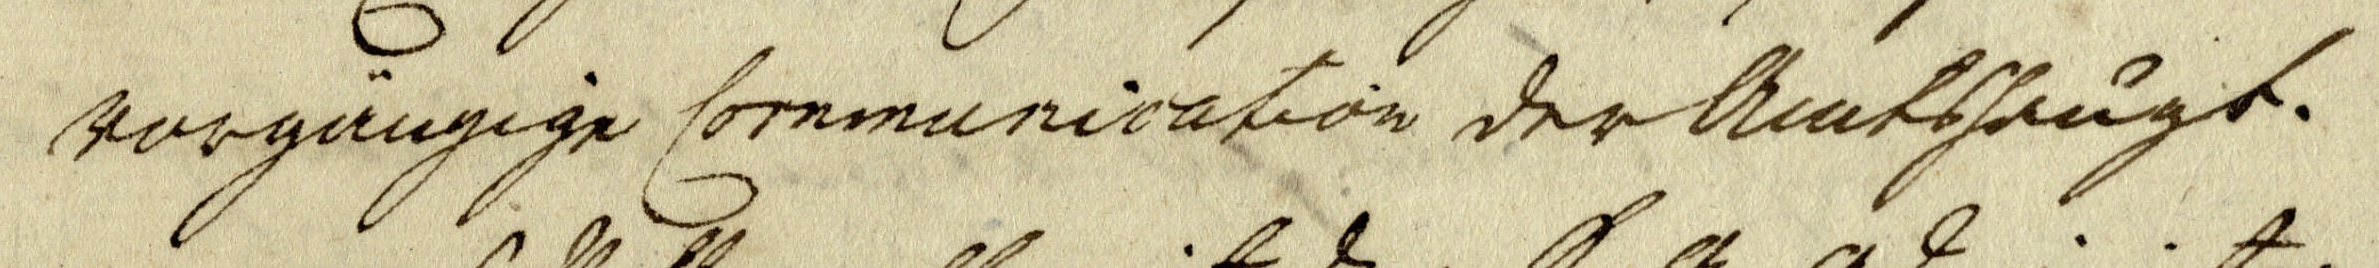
vorgängige Communication der Amtshaupt¬
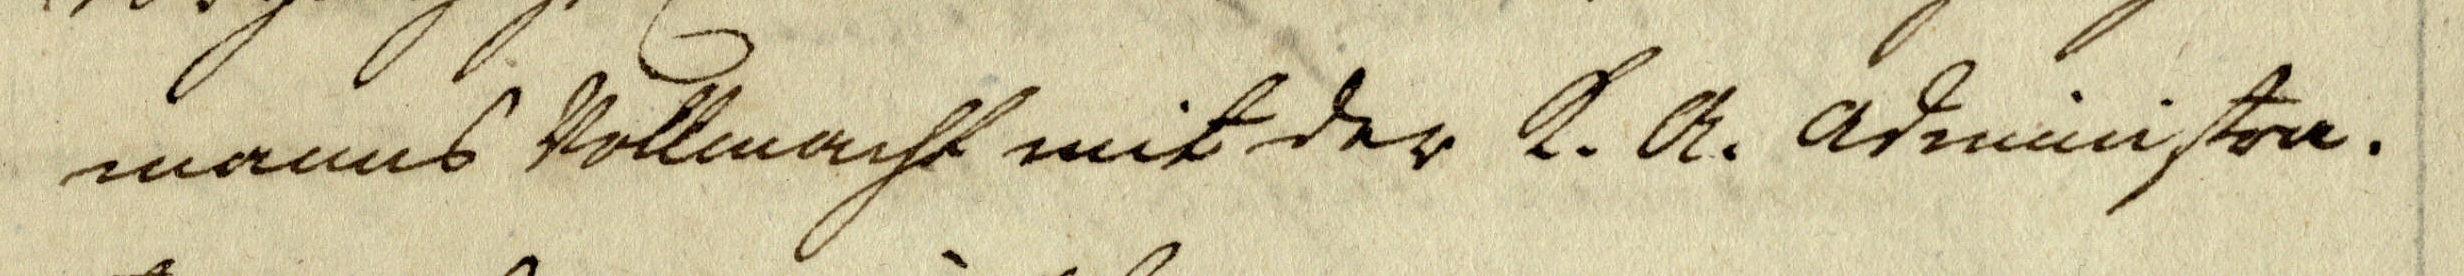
manns Vollmacht mit der K. A. Administra¬
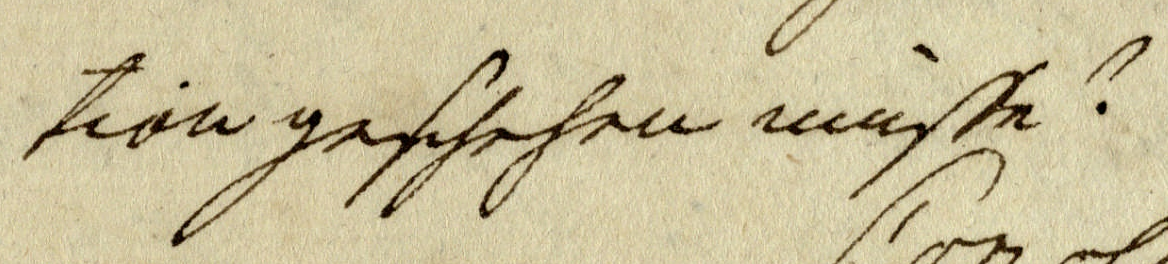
tion geschehen müsse?
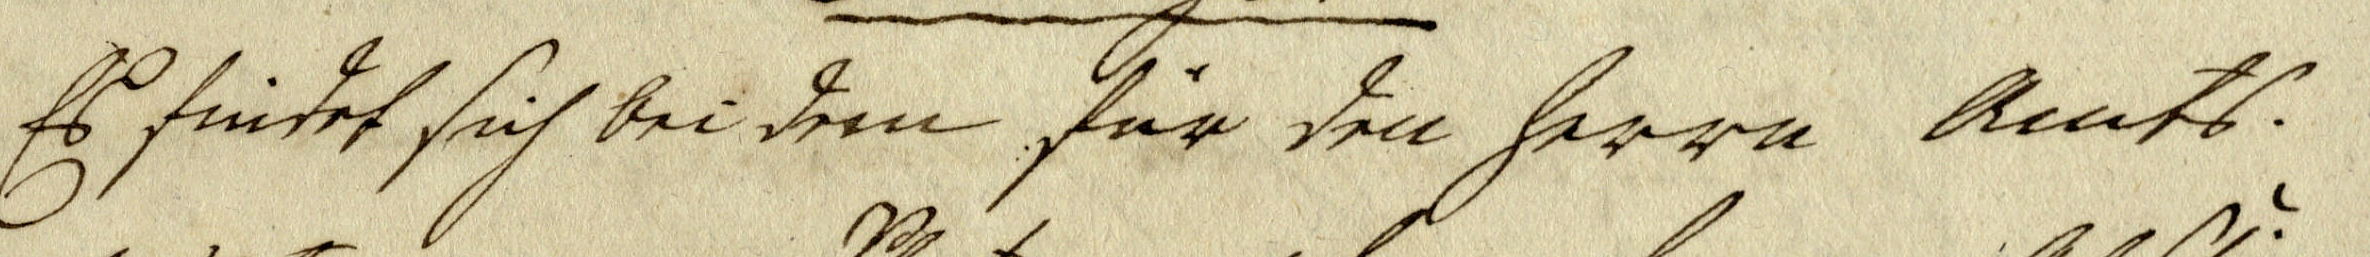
Er findet sich bei dem für den Herrn Amts¬
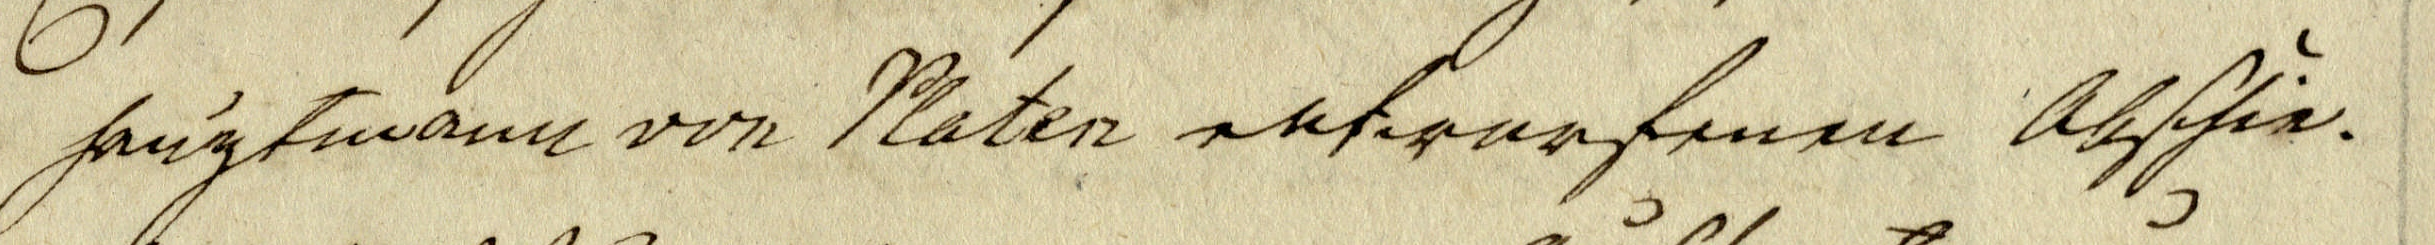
hauptmann von Platen entworfenen Abschie¬
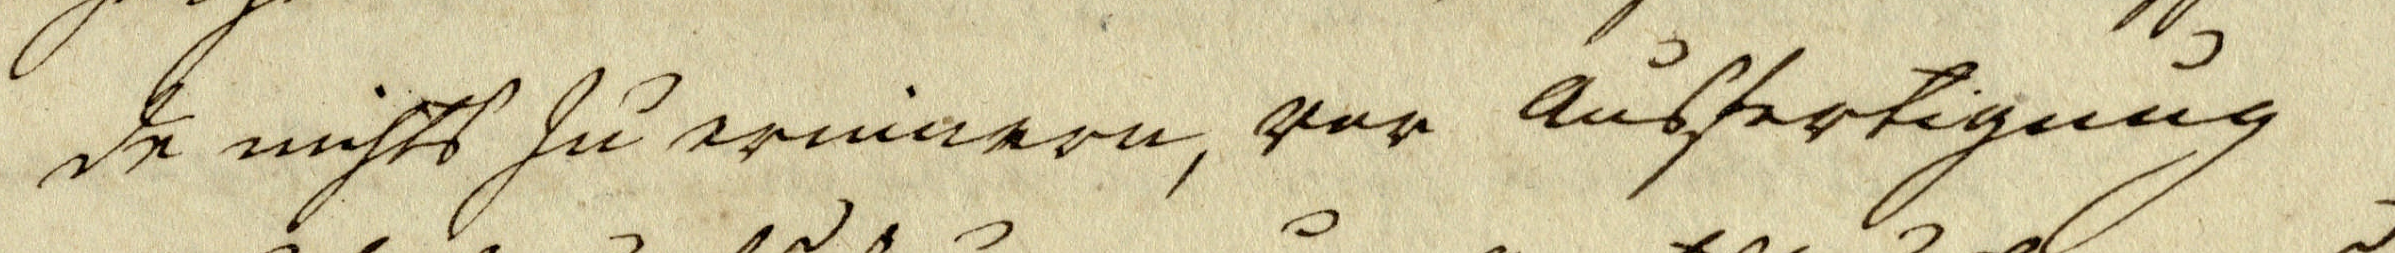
de nichts zu erinnern, vor Ausfertigung
